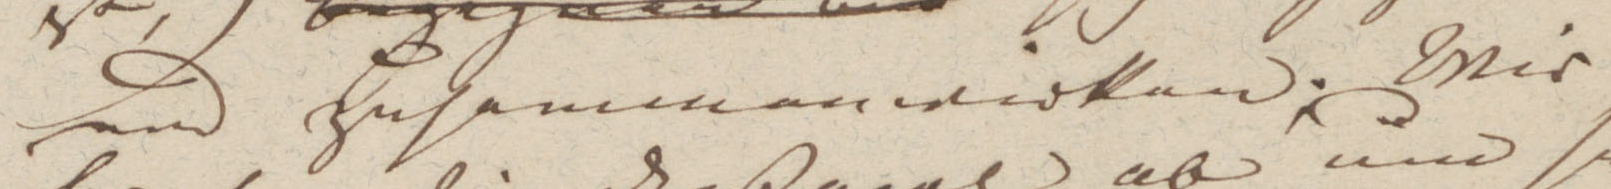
und zusammenwirken; Wir
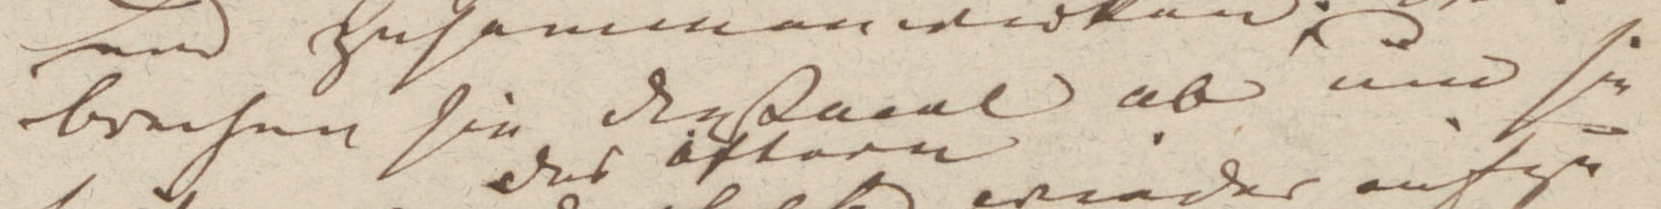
brechen sie diessmal ab um sie
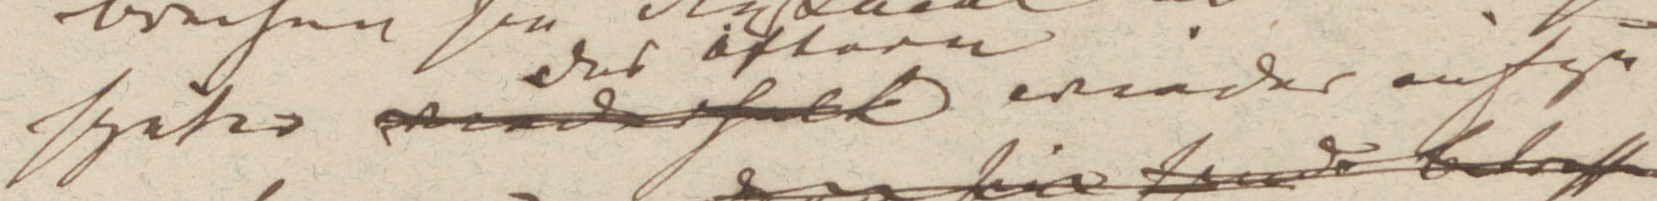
später wiederholt des öftern wieder aufzu
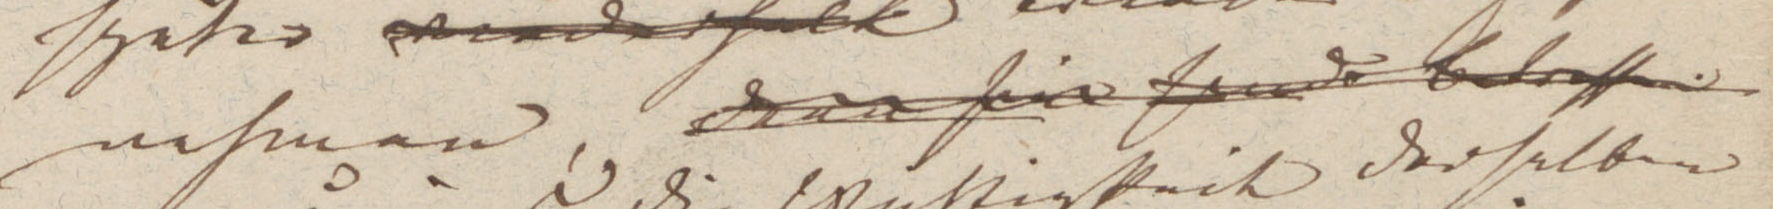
nehmen, denn sie sind betroffen
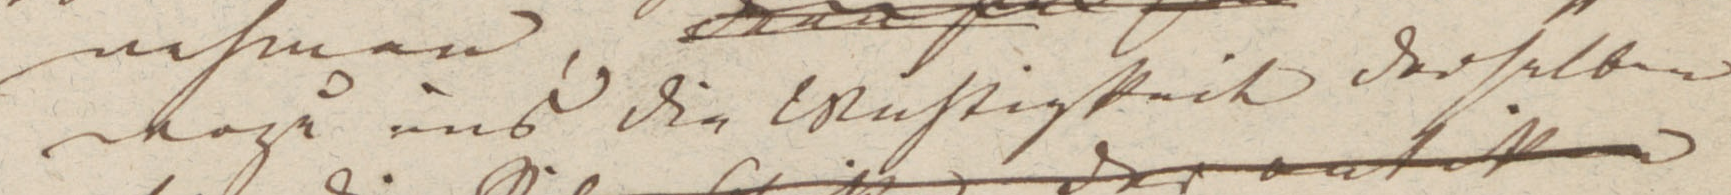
wozu uns die Wichtigkeit derselben
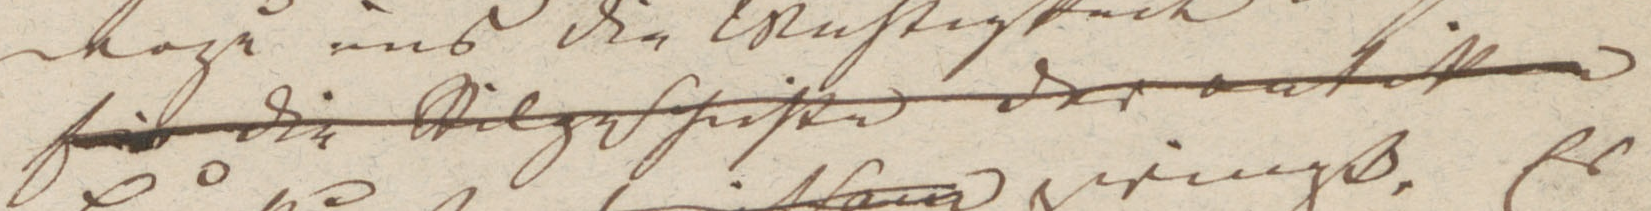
für die Stilgeschichte der antiken
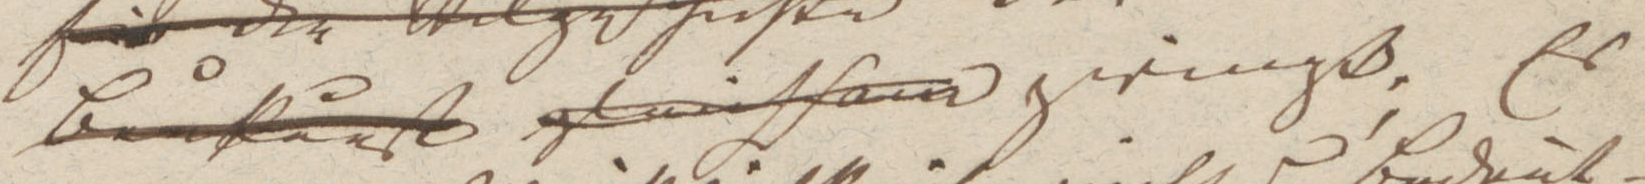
Baukunst gleichsam zwingt. Es
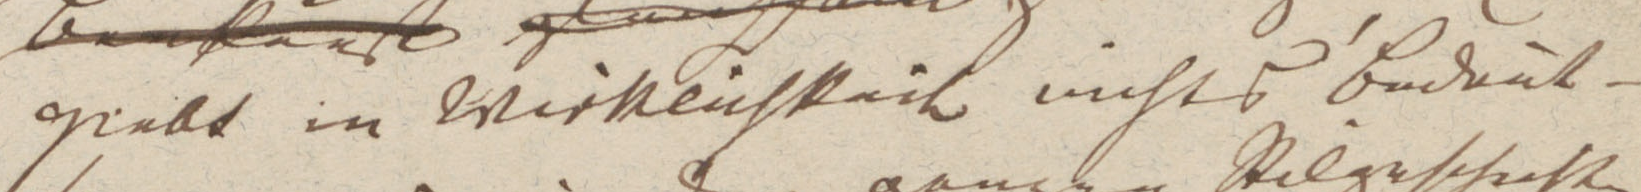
giebt in Wirklichkeit nichts Bedeut-
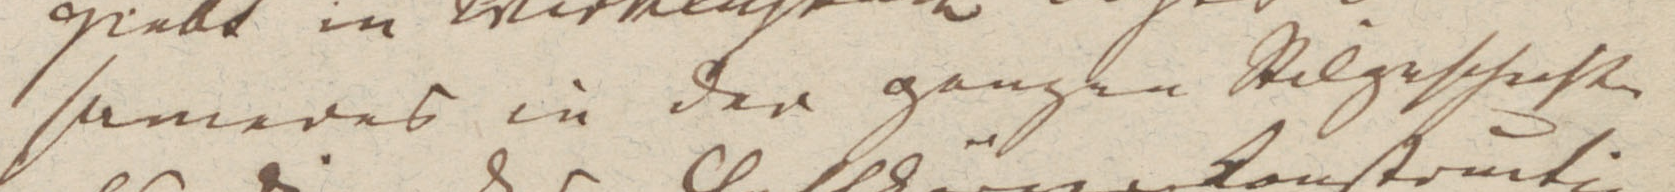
sameres in der ganzen Stilgeschichte
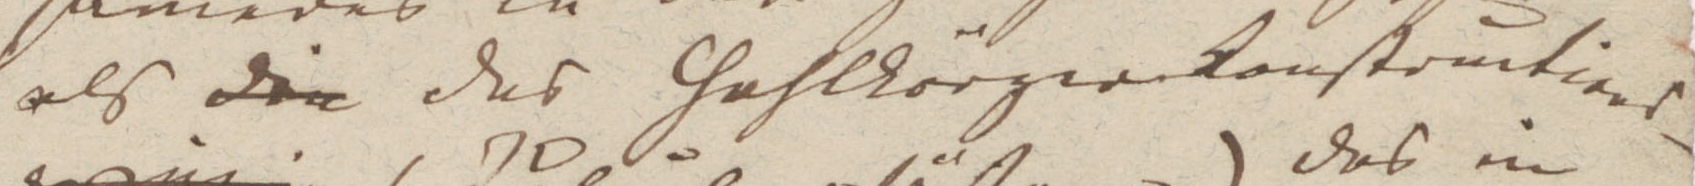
als die das Hohlkörperkonstructions-
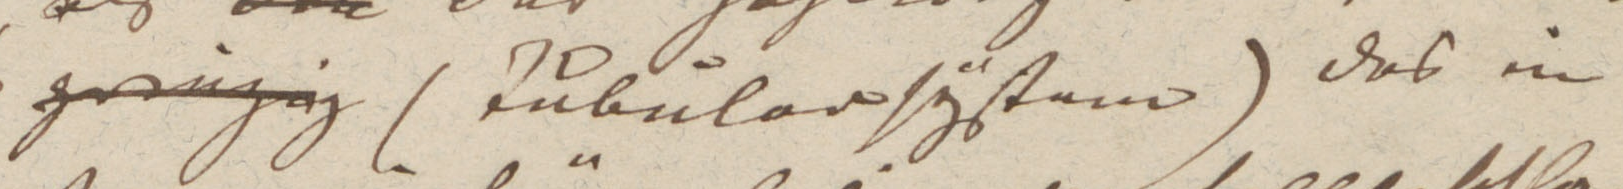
prinzip (Tubularsystem) das in
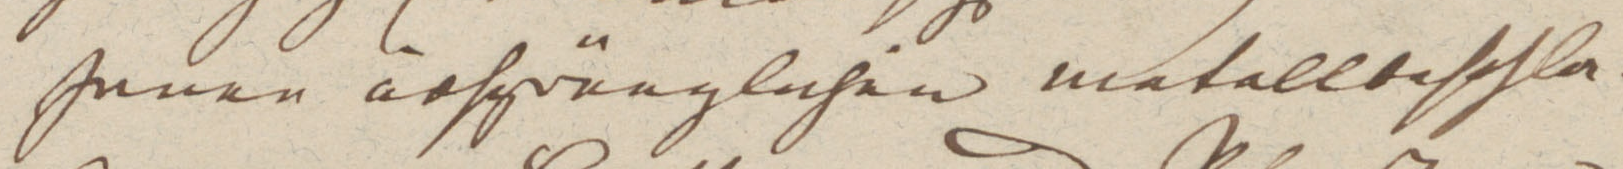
jenen ursprünglichen metallbeschla-
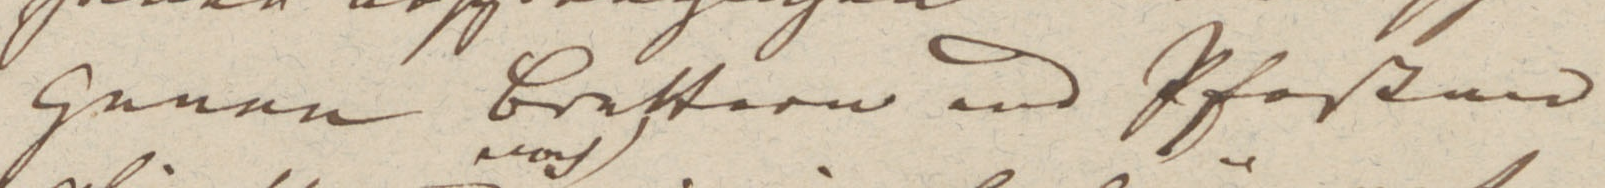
genen Brettern und Pfosten
